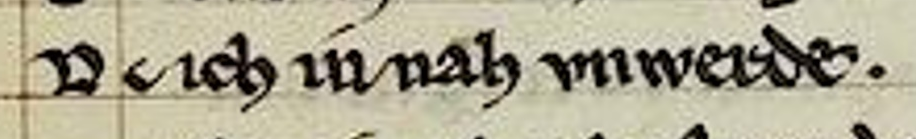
D(az) ich in nah vnwerde.
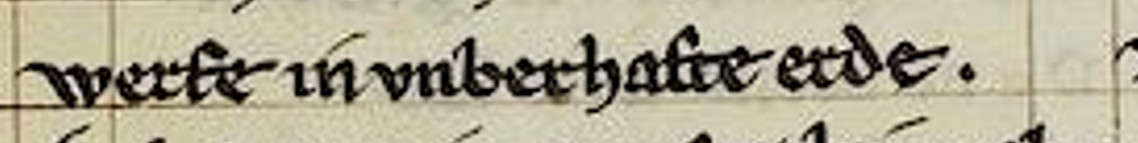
Werfe in vnberhafte erde.
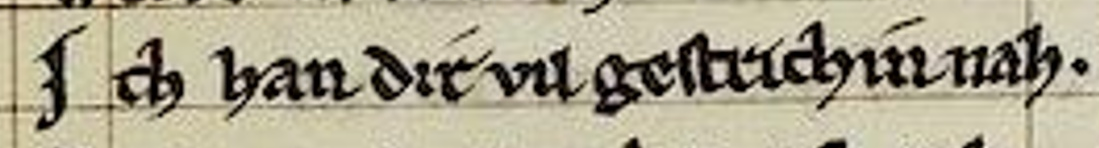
Ich han dir vil geſtrichin nah.
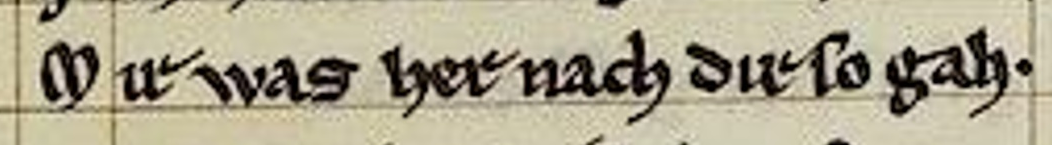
Mir was her nach dir ſo gah.
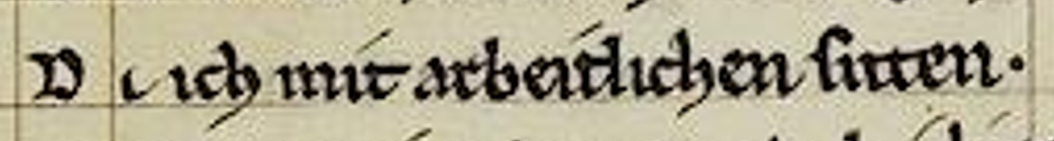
D(az) ich mit arbeitlichen ſitten.
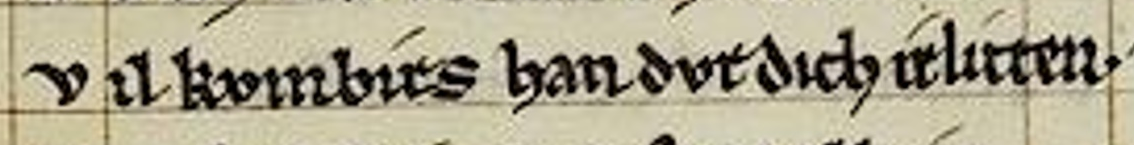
Vil kvmbirs han dvr dich irlitten.
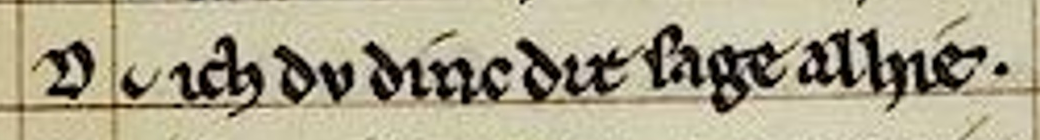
D(az) ich dv dinc dir ſage alhie.
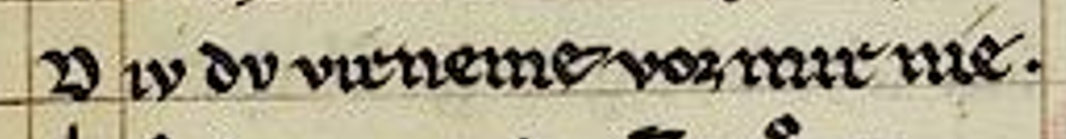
Div dv virneme vor mir nie.
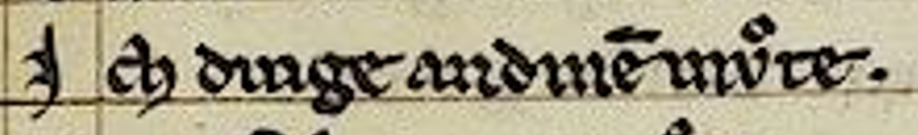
Ich dinge andine(n) mv°ote.
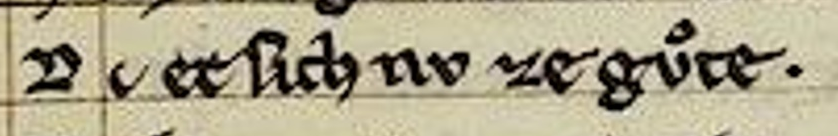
D(az) er ſich nv ze gv°ote.
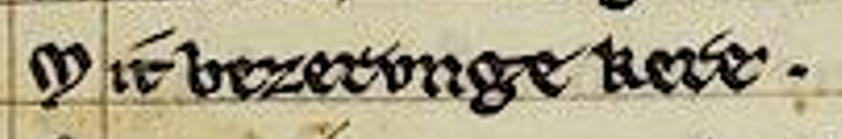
Mit bezervnge kere.
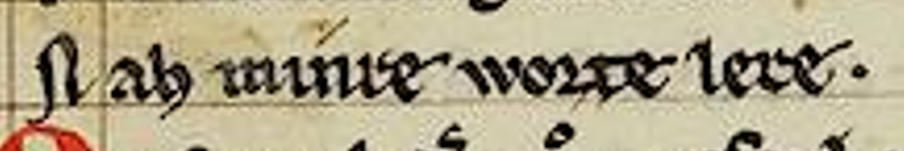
Nah minre worte lere.
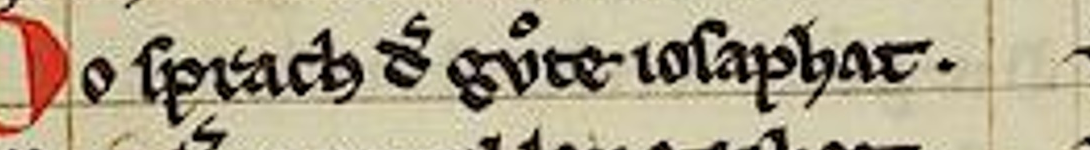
*Do ſprach d(er) gv°ote ioſaphat.
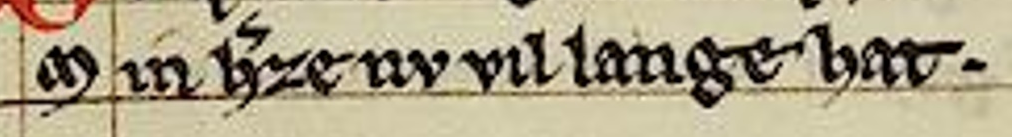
Min h(er)ze nv vil lange hat.
